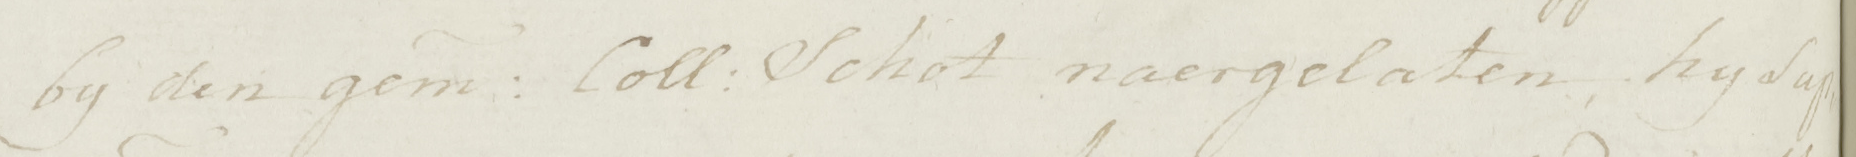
bij den gem: Coll. Schot naergelaten, hy Sup„
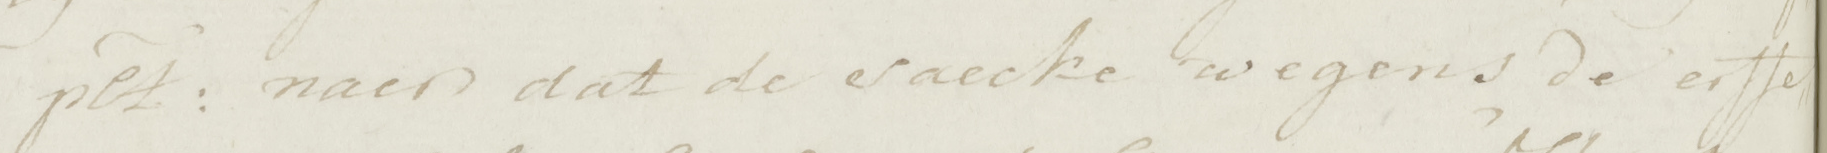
plt. naer dat de saecke teegens de erffe„
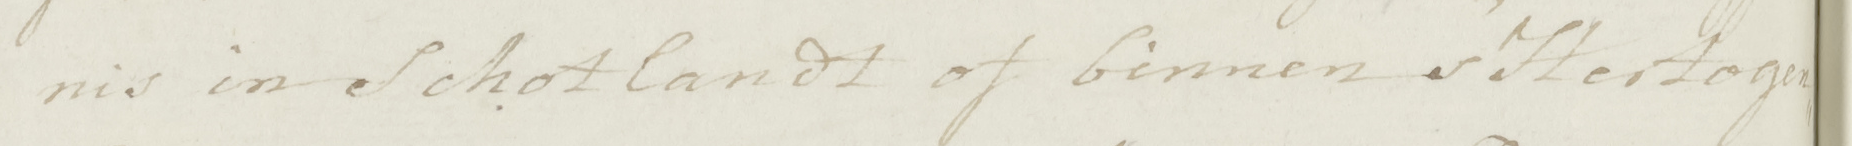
nis en Schotlandt of binnen s'Hertogen
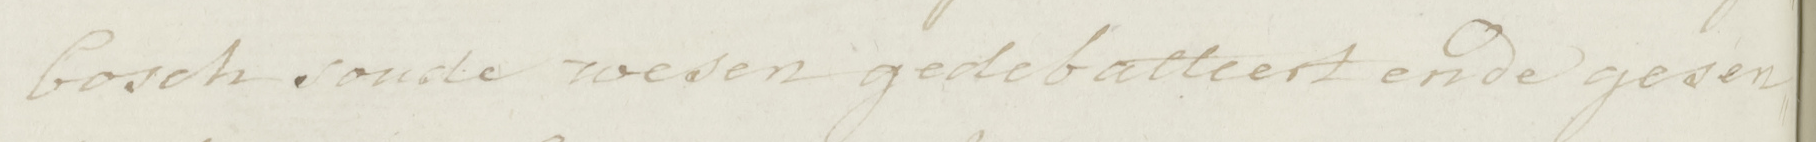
bosch soude wesen gedebatteert ende gesen
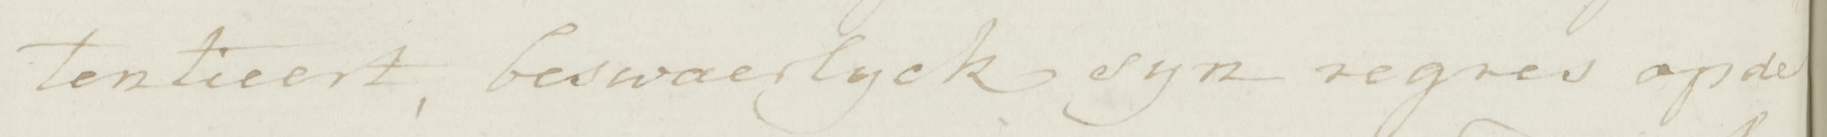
tentieert, beswaerlijck sijn regres op de
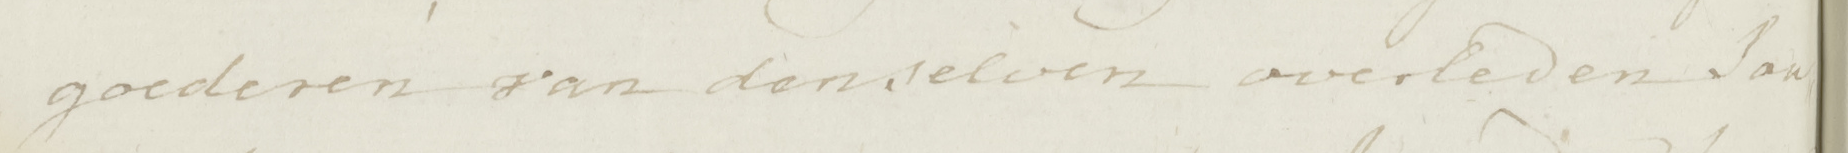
goederen van denselven overleden Sou
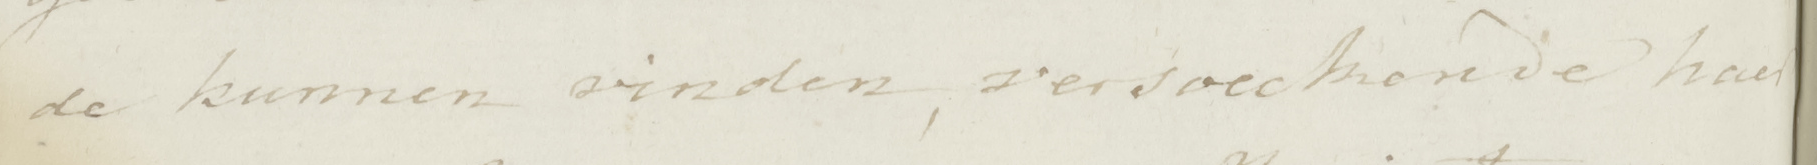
de kunnen vinden, versoecken de haer
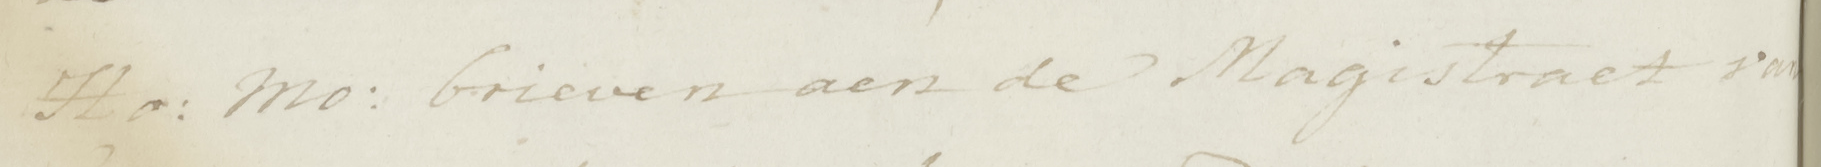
Ho: Mo: brieven aen de Magistraet van
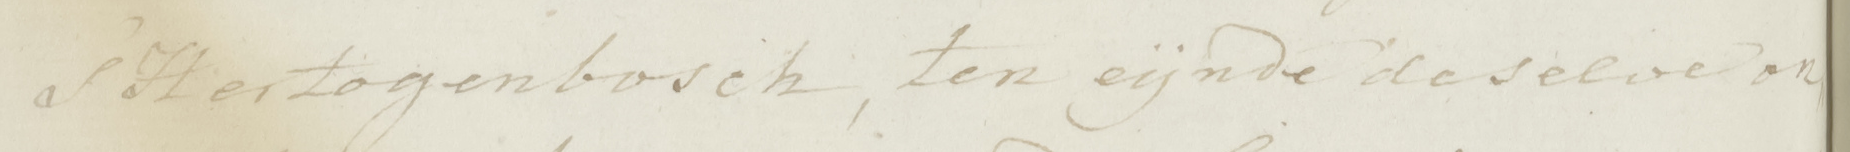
S'Hertogenbosch, ten eijnde deselve on
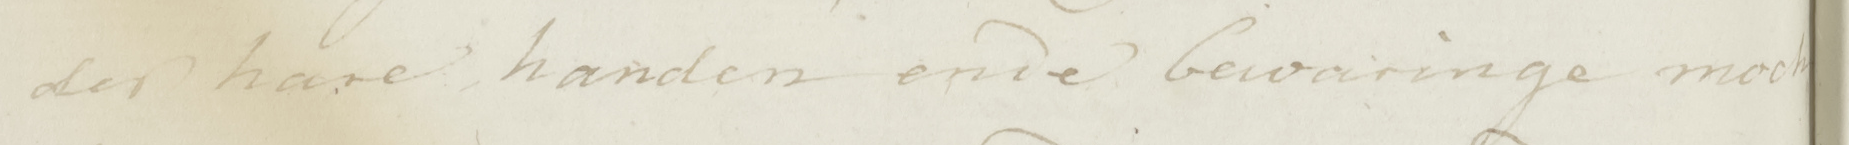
der hare handen ende bewaringe moch
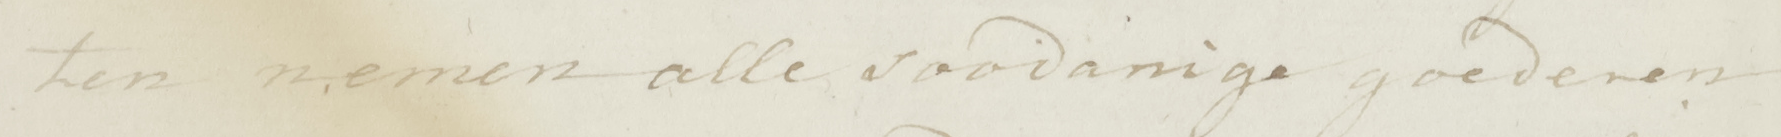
ten nemen alle soodanige goederen
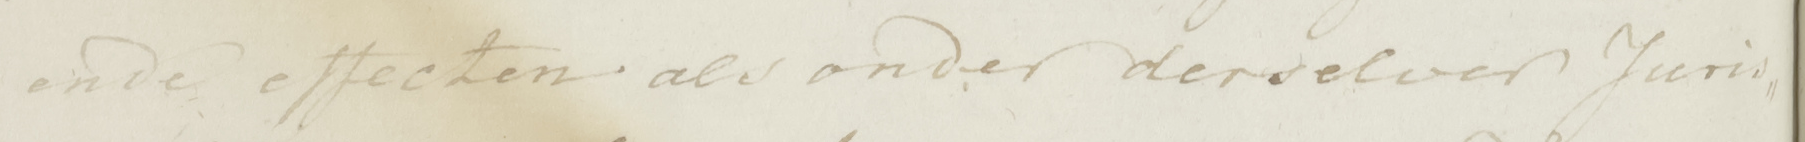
ende effecten als onder derselver Juris„
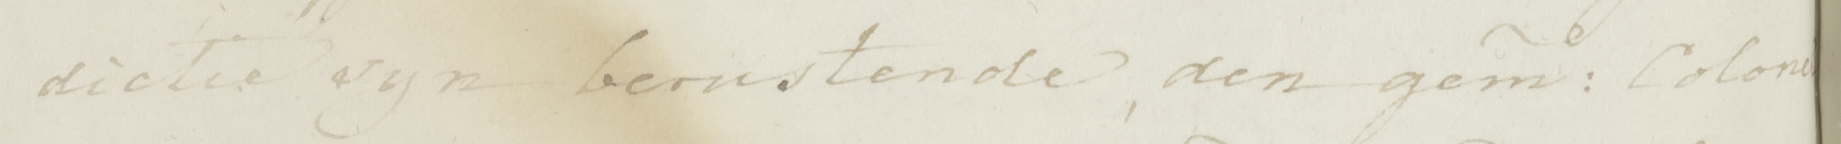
dictie syn berustende, den geme: Colone
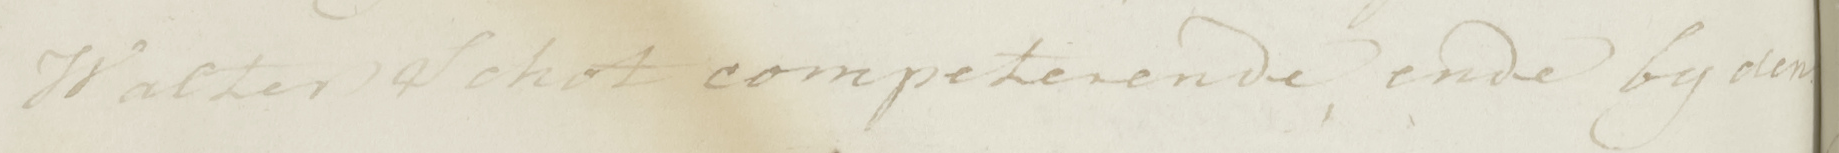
Walter, Schot competerende ende by den
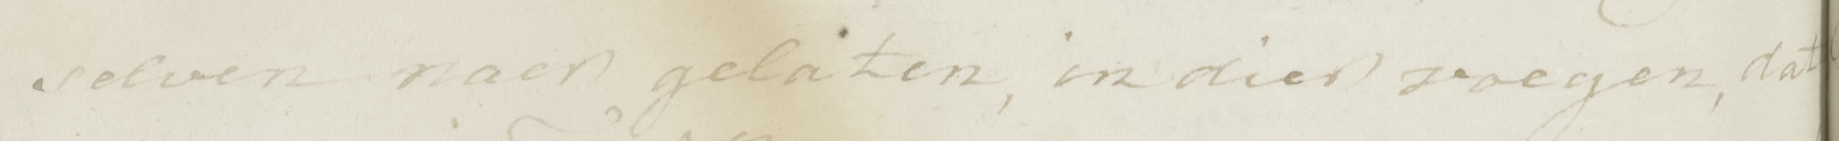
selven naer gelaten, in dier voegen dat
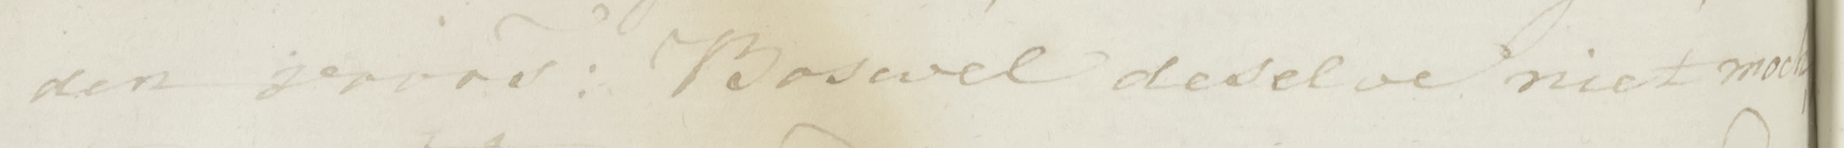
den voors: Boswel deselve niet moch
